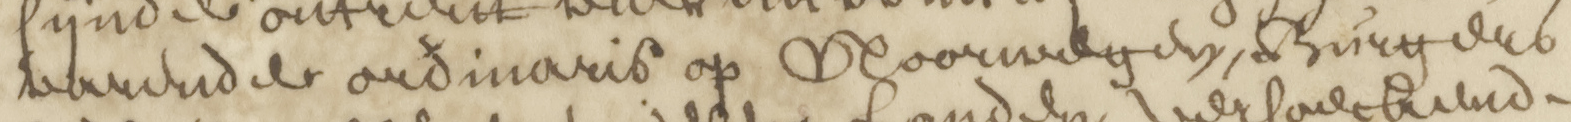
varende ordinaris op Noorwegen, Burgers
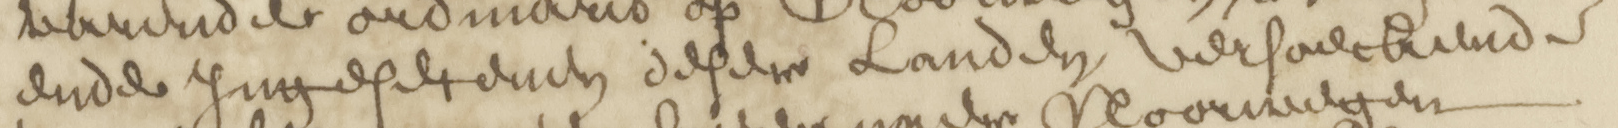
ende Ingesetenen deser Landen, versoeckende
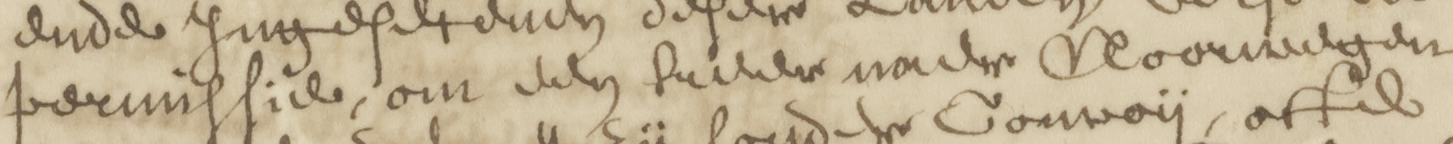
permissie, om een keer naer Noorwegen
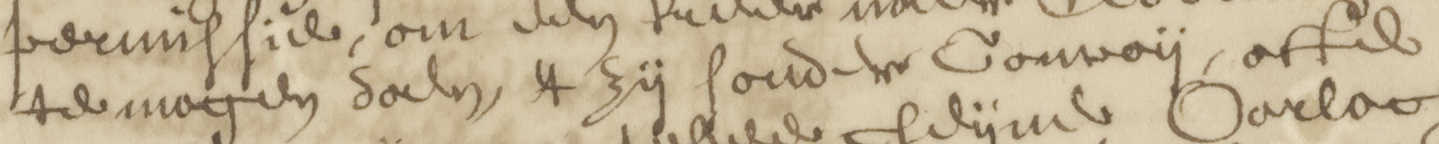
te mogen doen ‛t zij sonder Convoij, ofte
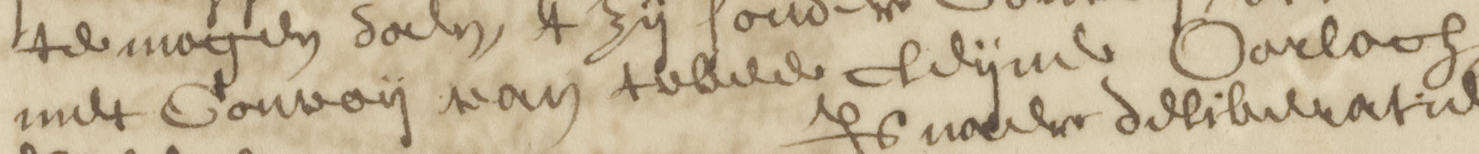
met Convoij van twee cleijne Oorloch„
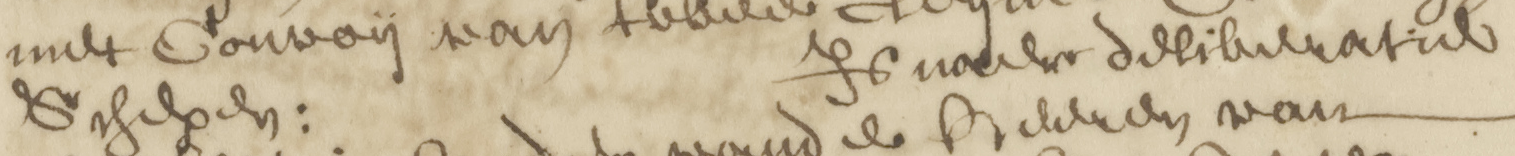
Schepen: Is naer deliberatie
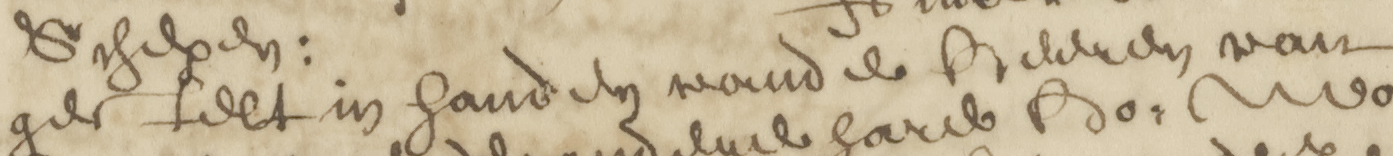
gestelt in handen vande Heeren van
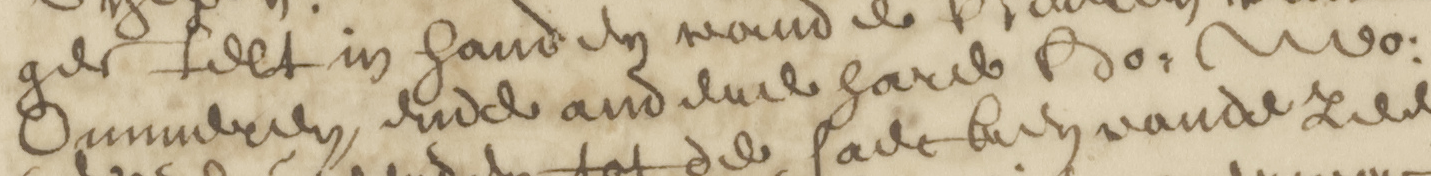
Ommeren, ende andere hare Ho:Mo:
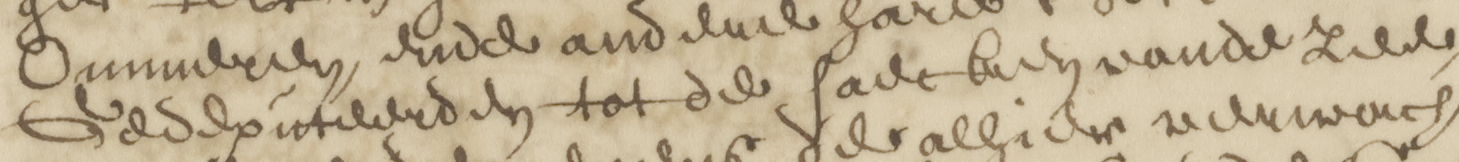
Gedeputeerden tot de saecken vande zee,
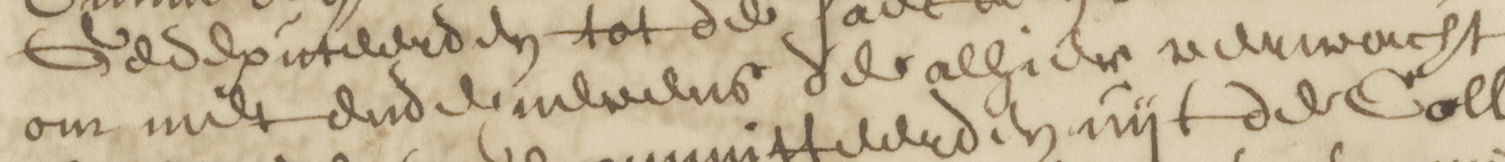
om met ende nevens de alhier verwacht
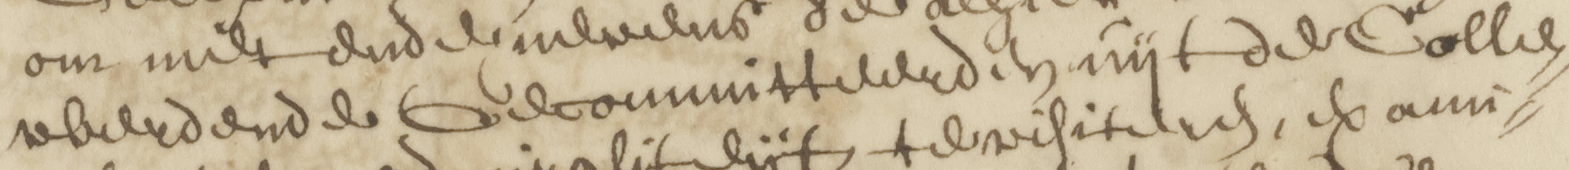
werdende Gecommitteerden uijt de Colle„
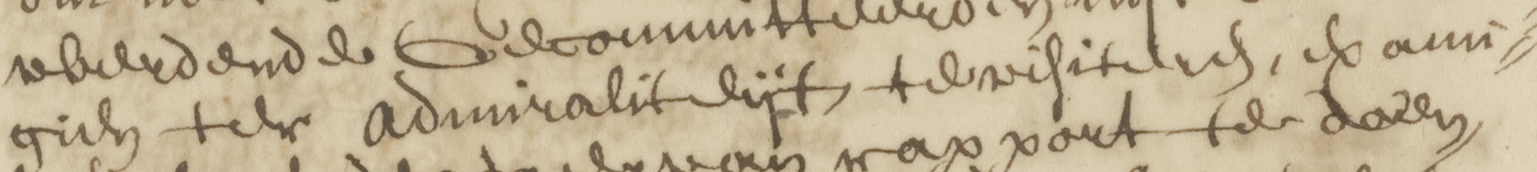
gien ter Admiraliteijt, te visiteren, exami„
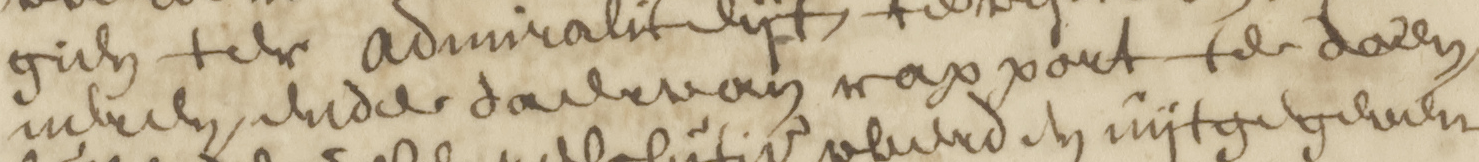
neren, ende daervan rapport te doen,
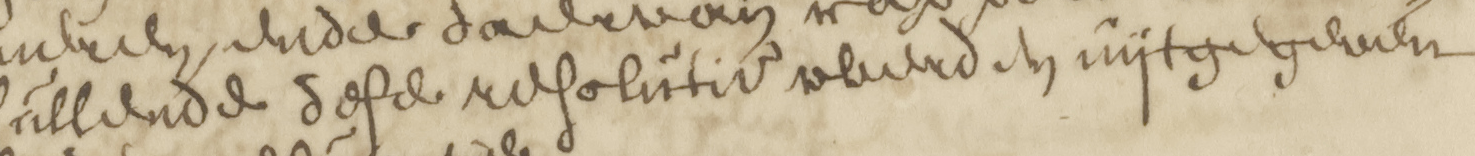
sullende dese resolutie werden uijtgegeven
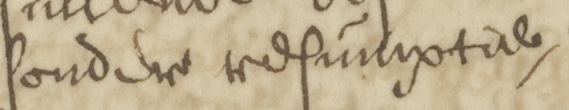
sonder resumptie.
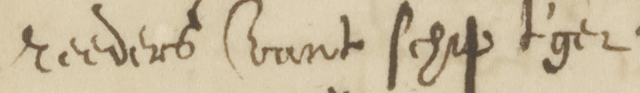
reeders vant schip t‛ ge„
